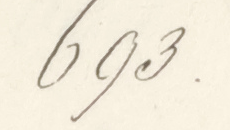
693.
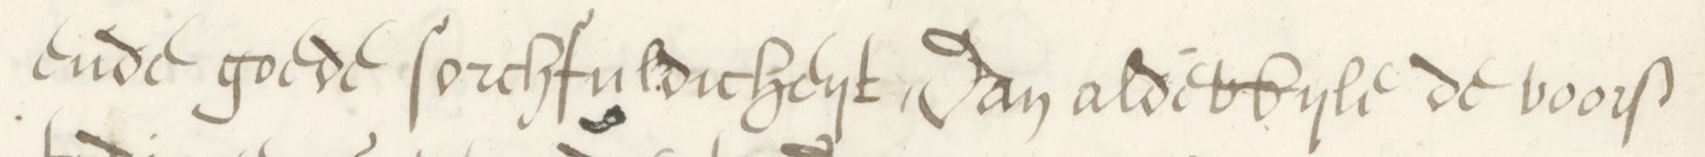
ende goede sorchfuldicheyt, dan aldewyle de voors
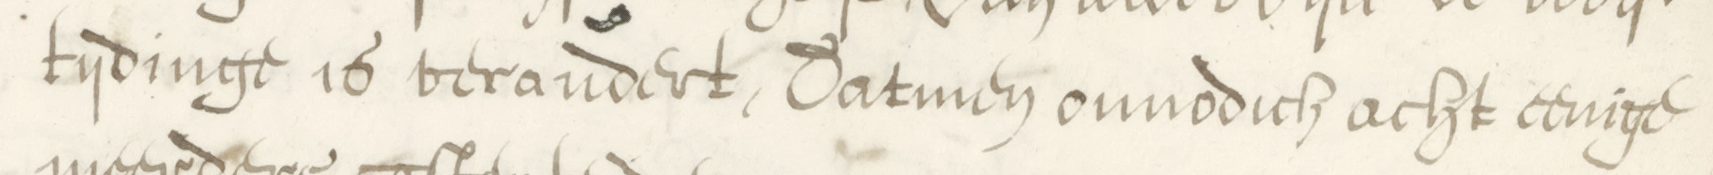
tydinge is verandert, datmen onnodich acht eenige
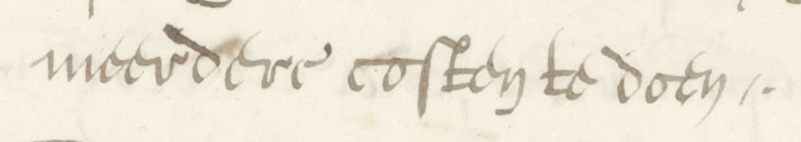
meerdere costen te doen.
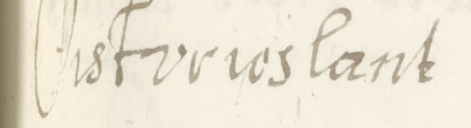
Oistvrieslant
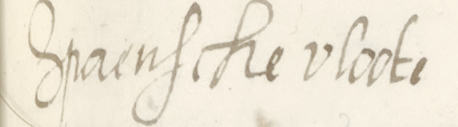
Spaensche vloote
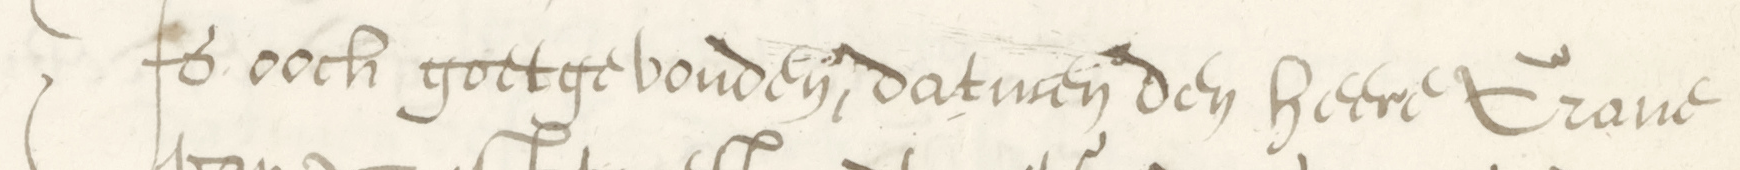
Is oock goetgevonden, datmen den heere Graue
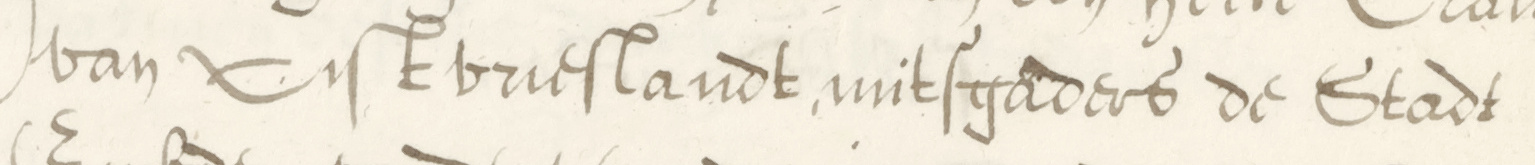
van Oistvrieslandt, mitsgaders de Stadt
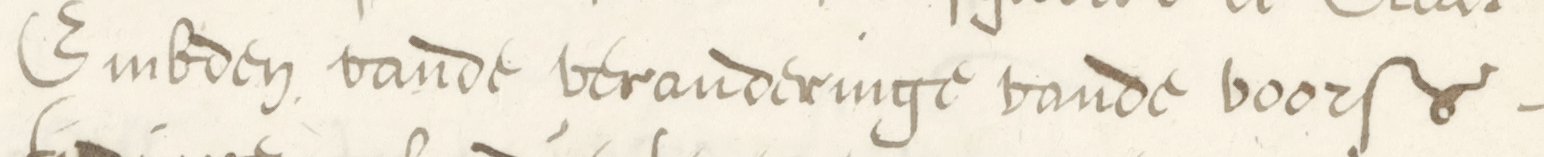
Embden vande veranderinge vande voors
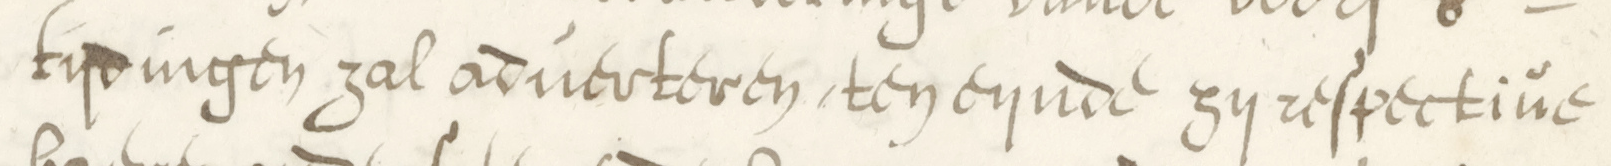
tydingen zal aduerteren, ten eynde zij respectiue
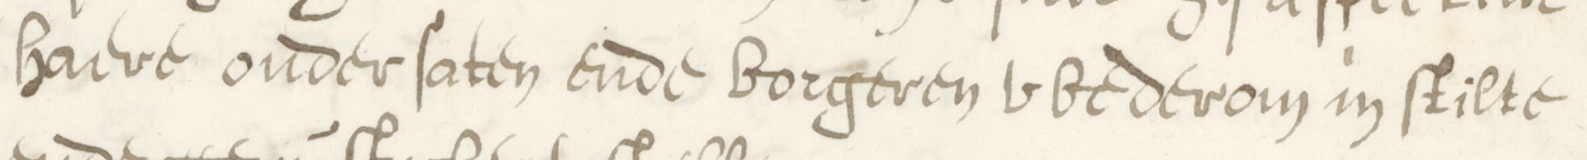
haere ondersaten ende borgeren wederom in stilte
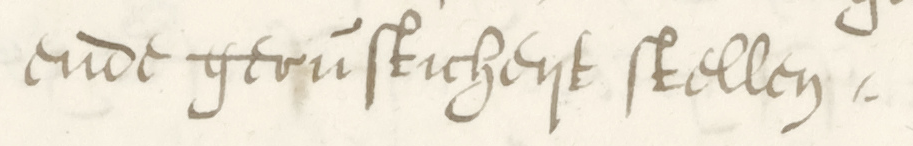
ende gerusticheyt stellen.
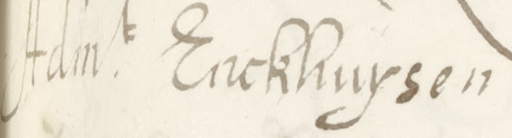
Admt. Enckhuysen
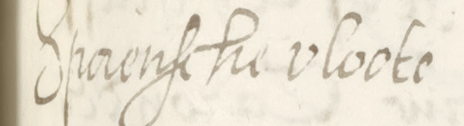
Spaensche vloote
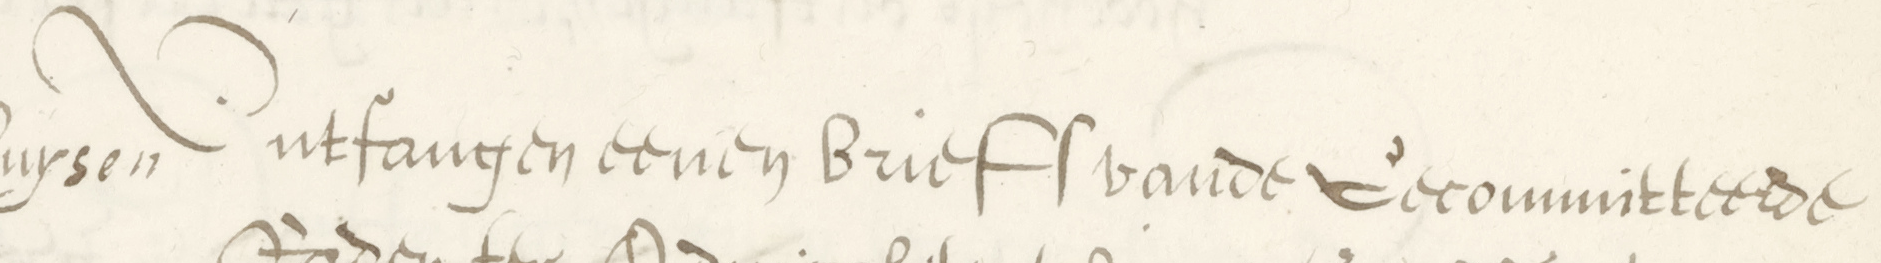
Ontfangen eenen brieff vande Gecommitteerde
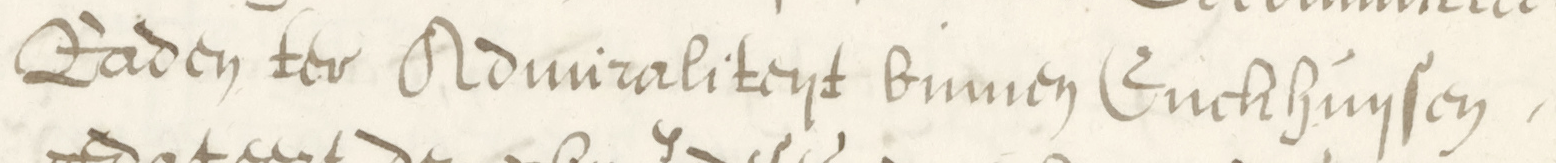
Raden ter Admiraliteyt binnen Enckhuysen
